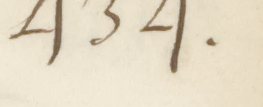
434.
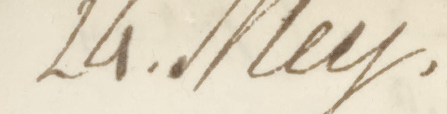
24. Mey.
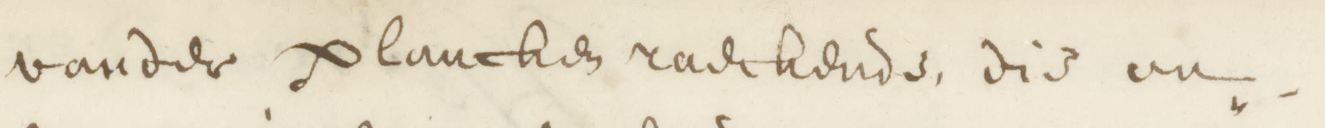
van der Plancken raeckende, die on„
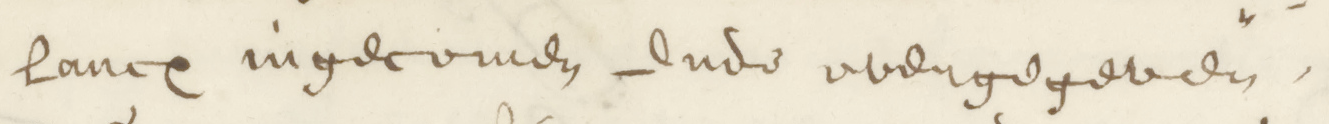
lancx ingecomen ende overgegeven
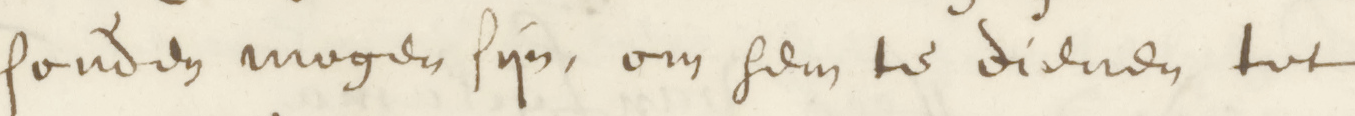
souden mogen sijn, om hem te dienen tot
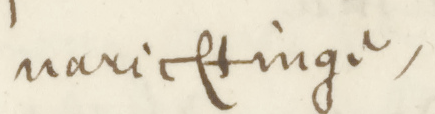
narichtinge.
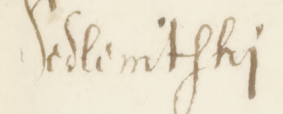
Sedlenitski
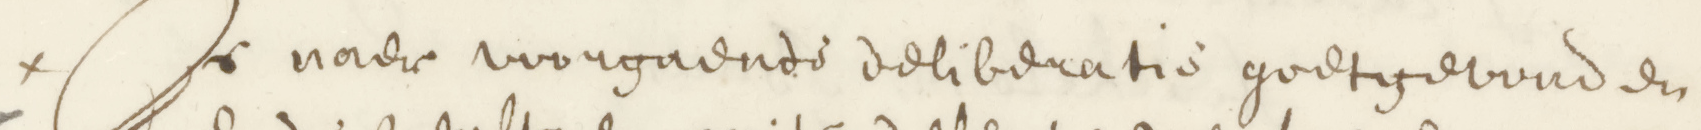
Is naer voorgaende deliberatie goetgevonden
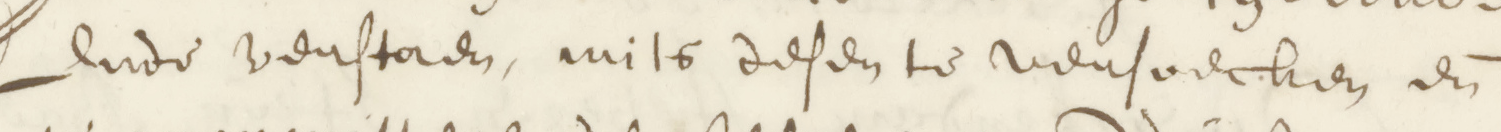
ende verstaen, mits desen te versoecken en
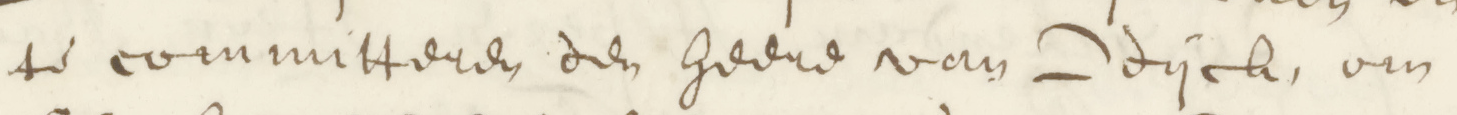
te committeren den heere van Odijck, om
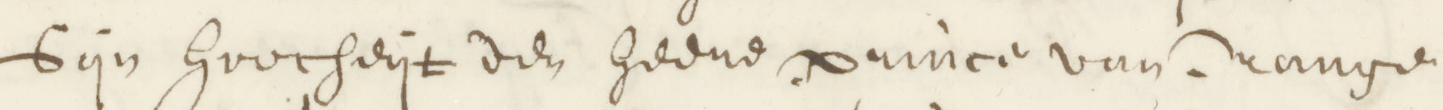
Sijn hoocheijt den heere prince van Orange
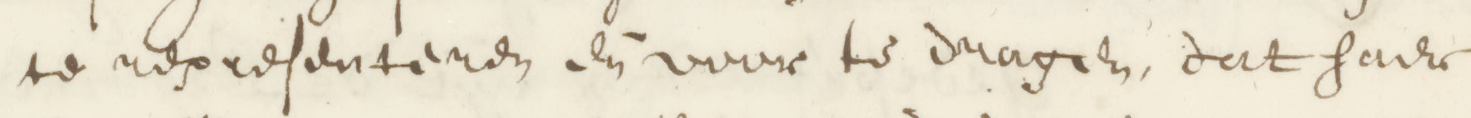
te representeren en voor te dragen, dat haer
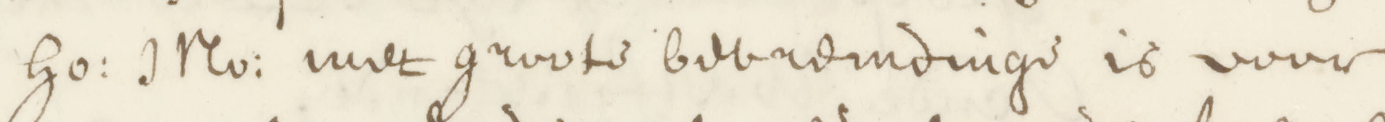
Ho:Mo: met groote bevremdinge is voor
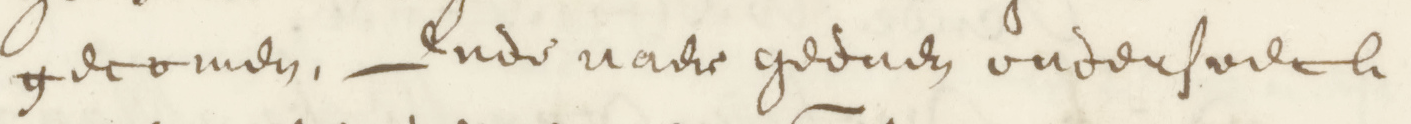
gecomen, Ende naer gedaen ondersoeck
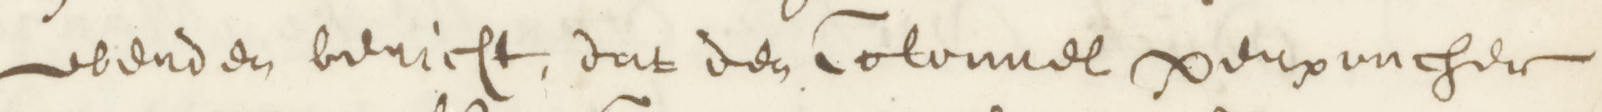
werden bericht, dat den Colonnel Perponcher
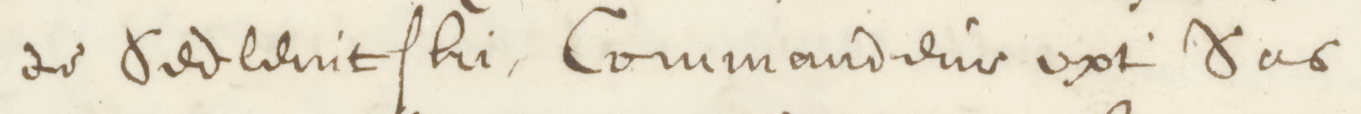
de Sedlenitski, Commandeur opt' Sas
